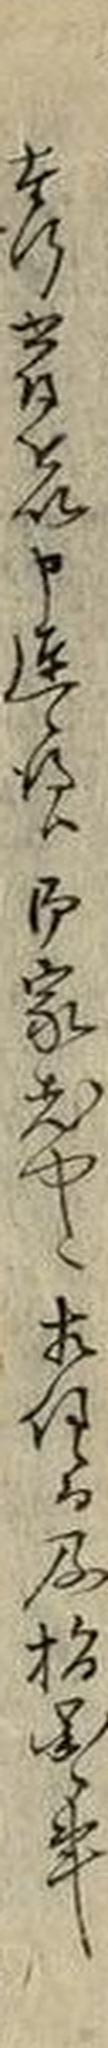奉行書付を以申達候得は御家老中へ相伺候て及指図候事
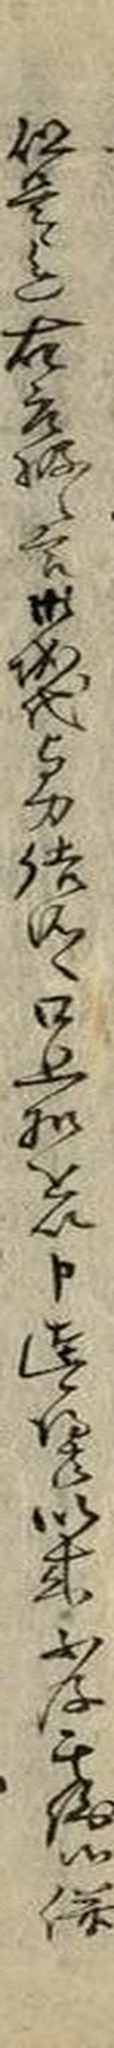但是迄右取扱之節御城代与力詰所へ口上控を以申達候得共以来不及其儀候併
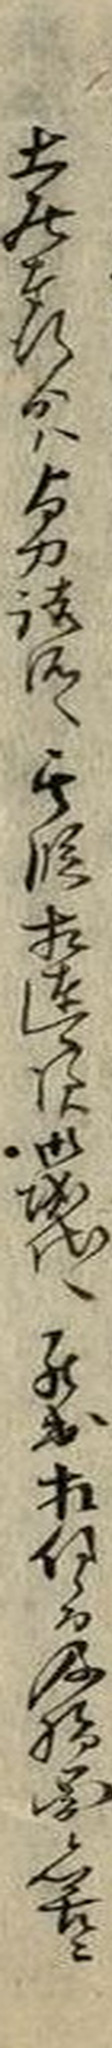土居奉行ゟは与力詰所へ其段相達候得は御城代へ罷出相伺候て及指図候筈に
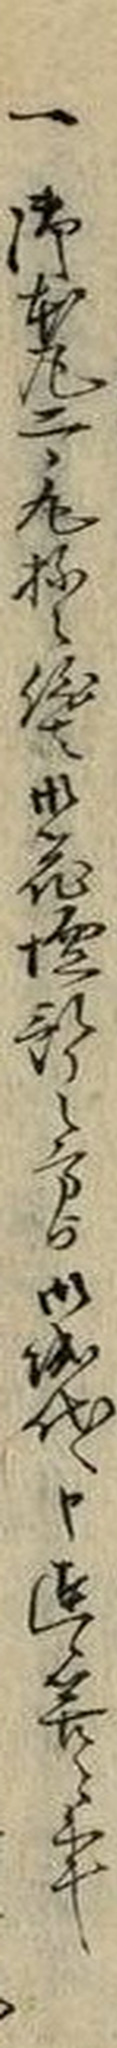一御本丸二ノ丸抔之儀は御花壇預り之方ゟ御城代へ申達候筈之事
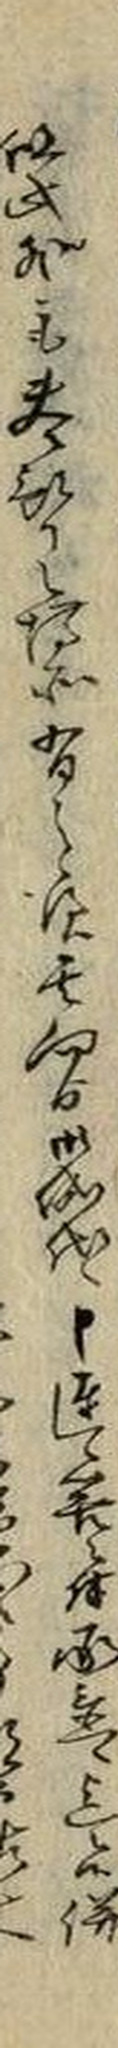但此外にも夫々預り之場所有之候得は其向ゟ御城代へ申達候筈に付承置候迄に候併
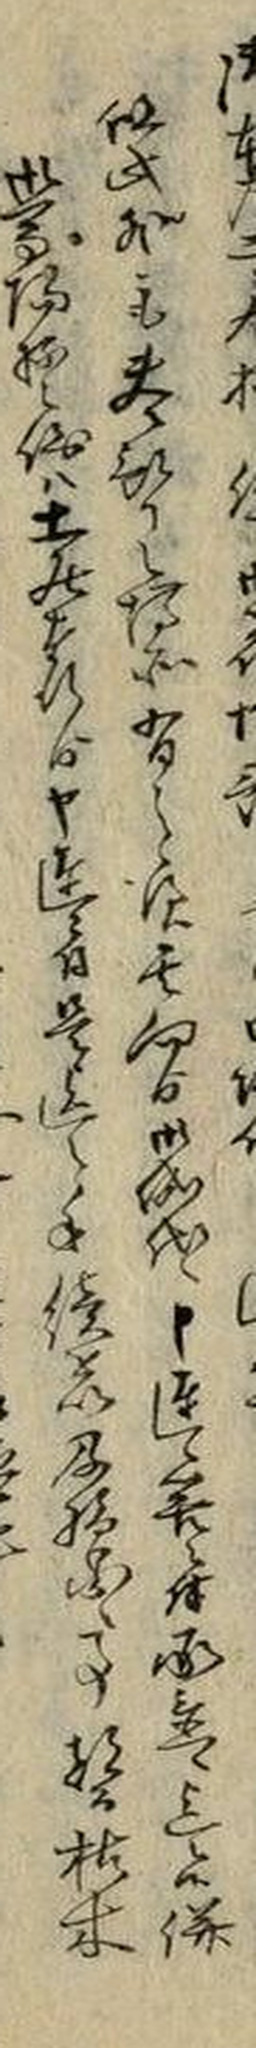御馬場抔之儀は土居奉行ゟ申達に付是迄之手続を以及指図候事都て枯木
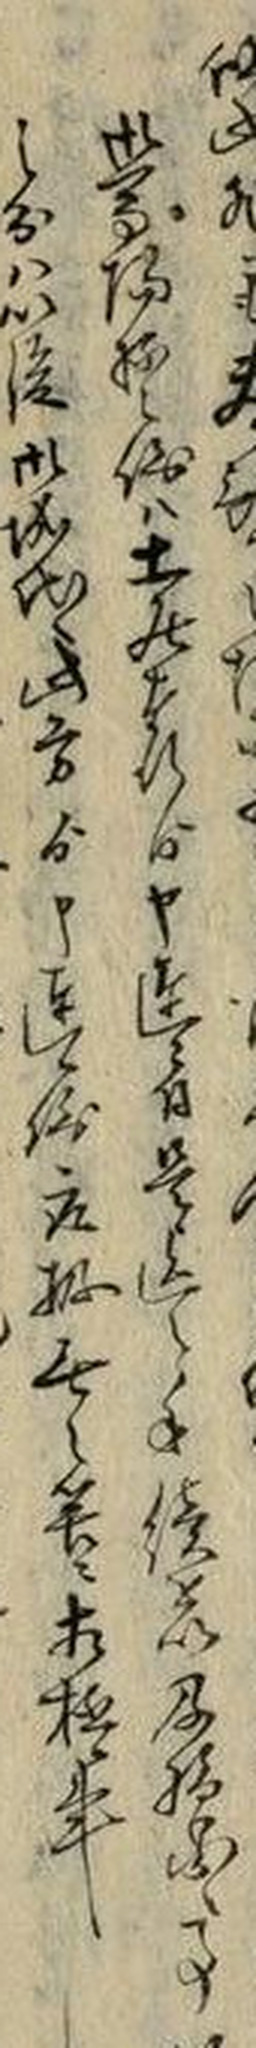之分は以後御城代へ此方ゟ申達候儀取扱無之筈に相極候事
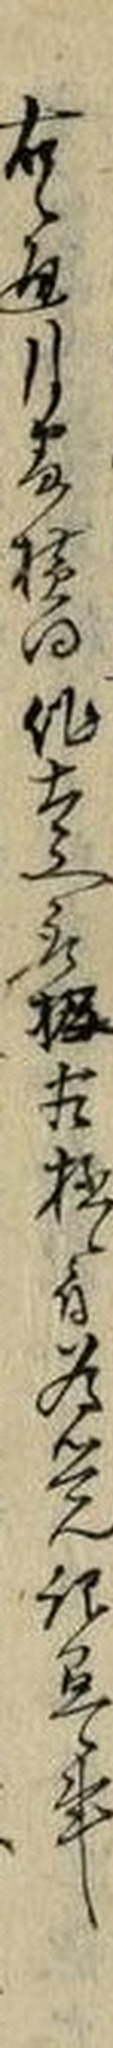右之通月番横田作大夫取扱相極候に付為覚記置候事
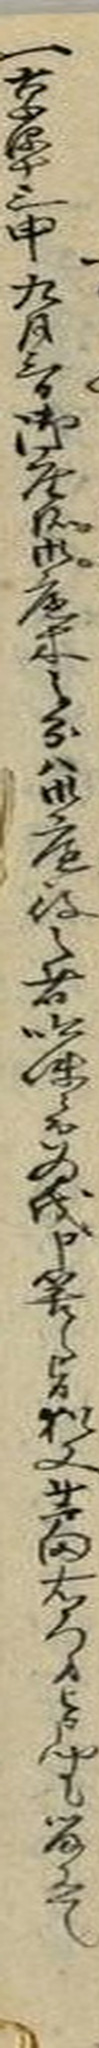一享保十三申九月三日御座所御庭木之分は御庭役之者吟味にて為伐申筈之旨猶又芦田右衛門方被申聞候留有之
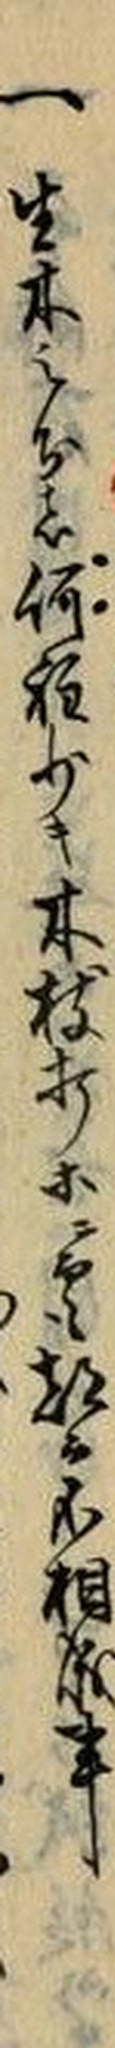一生木之分は何程少キ木枝打等にても都て不相成事
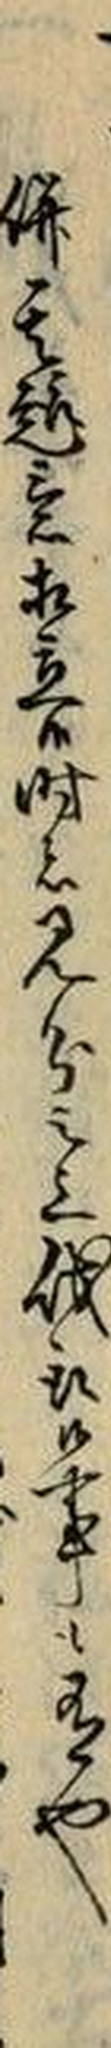併其趣意相立候時は見分之上伐取候事も有也
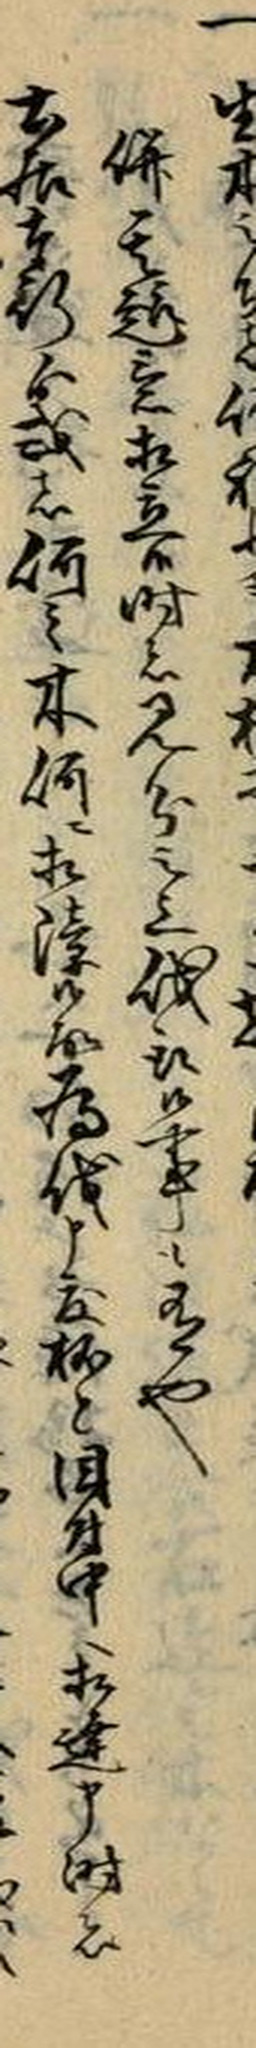土居奉行ゟ或は何之木何に相障候故為伐申度抔と目付中へ相達申時は
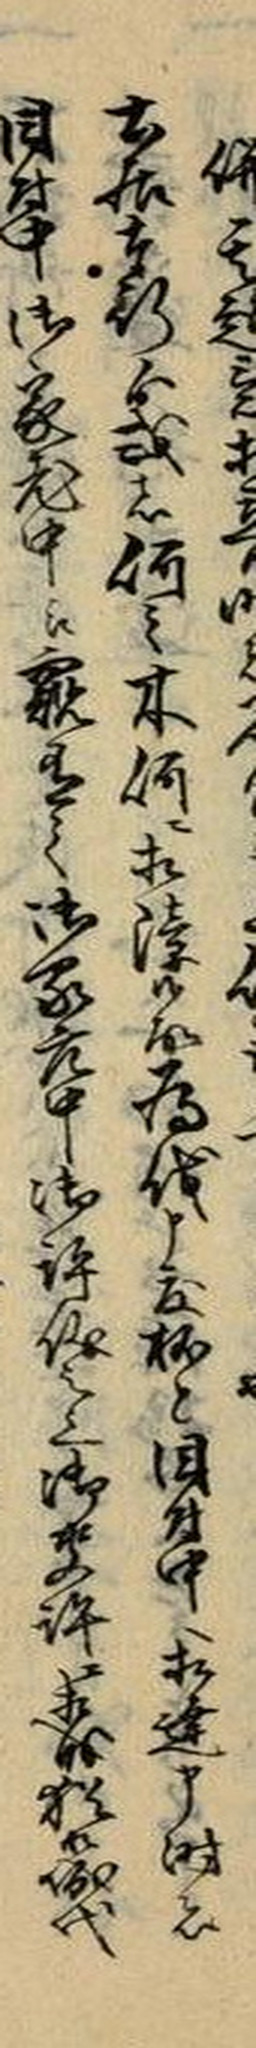目付中御家老中え窺有之御家老中御評儀之上御決評に相成猶御城代
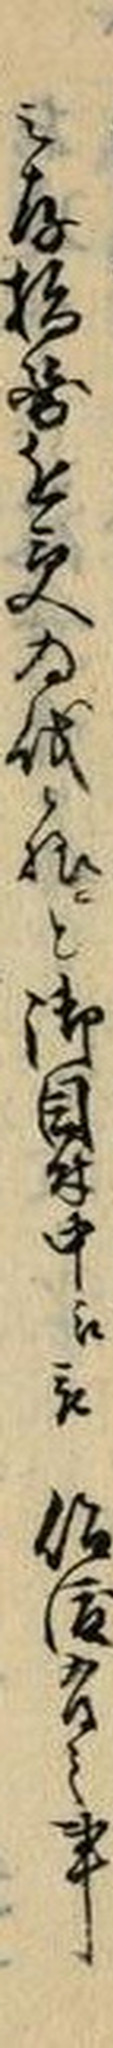之存指図を受為伐候様にと御目付中え被仰渡有之事
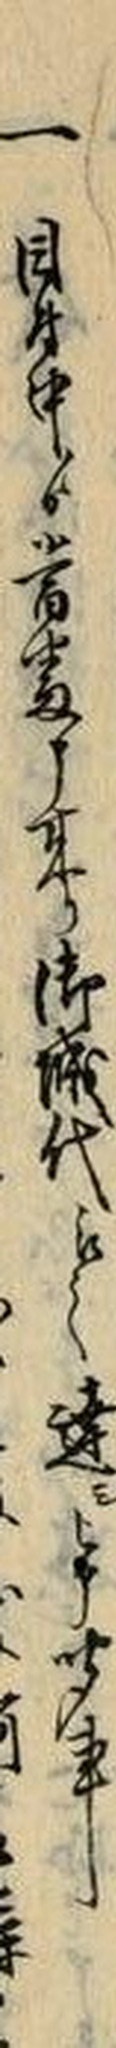一目付中ゟ当番申来り御城代え之達シ被申聞事
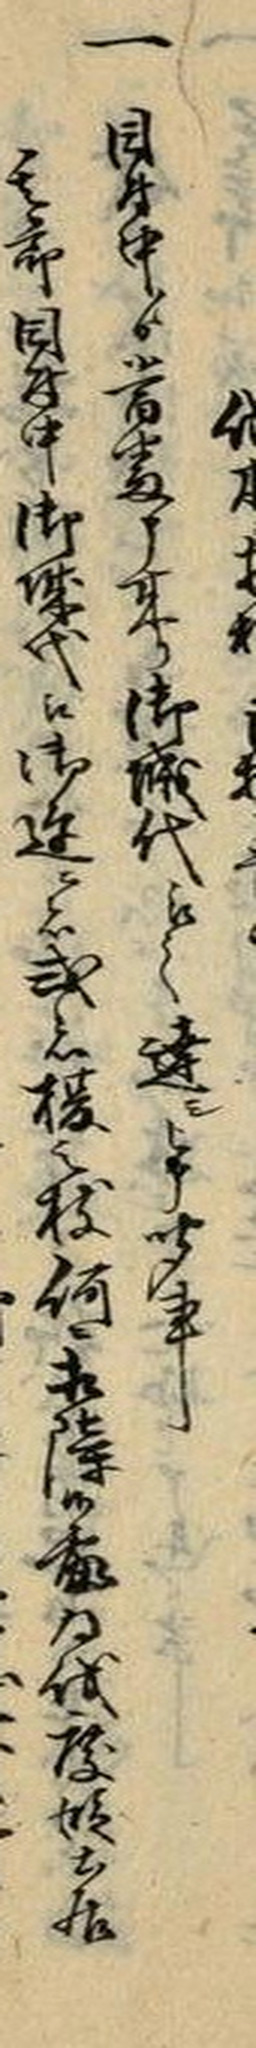其節目付中御城代え御達には或者榎之枝何に相障候故為伐度段土居
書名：御城下諸事之部
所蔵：福井県文書館 Fukui Prefectural Archives
